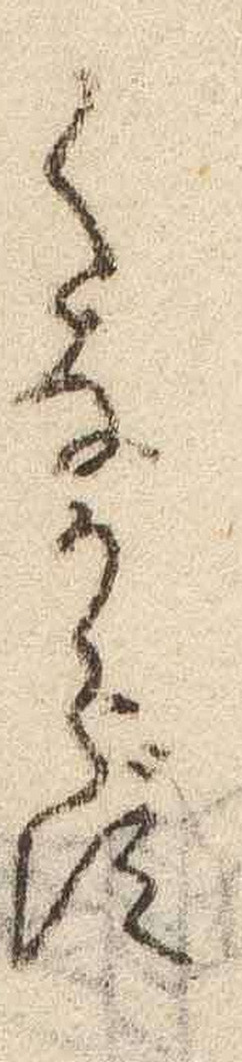くなからず
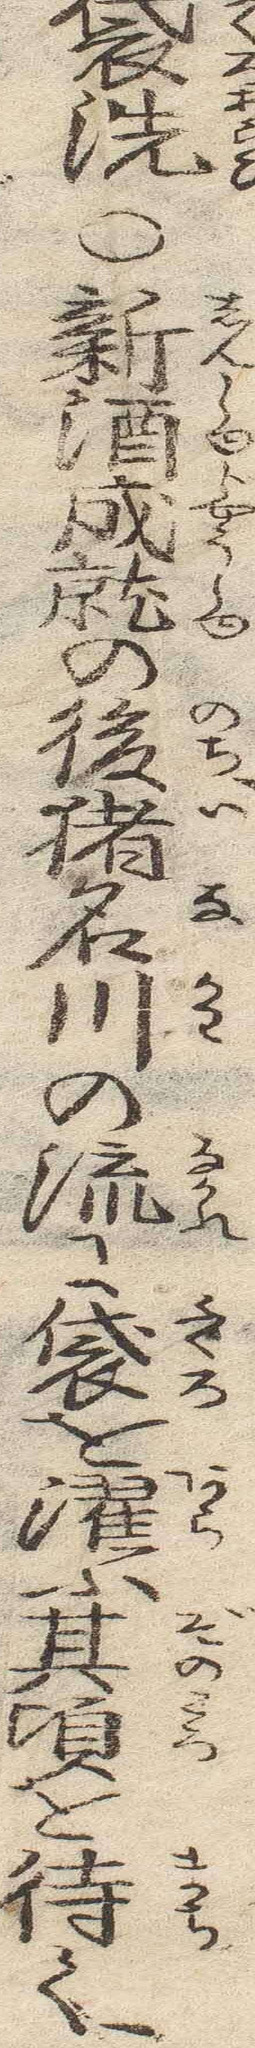袋洗○新酒成就の後。猪名川の流に袋を濯ふ其頃を待て。
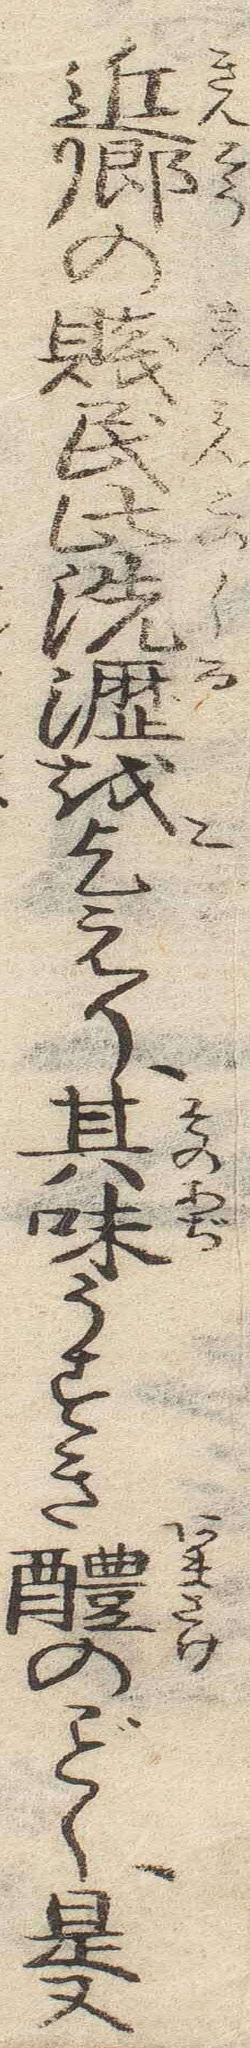近郷の賎民此洗瀝を乞えり。其味うすき醴のごとし。是又
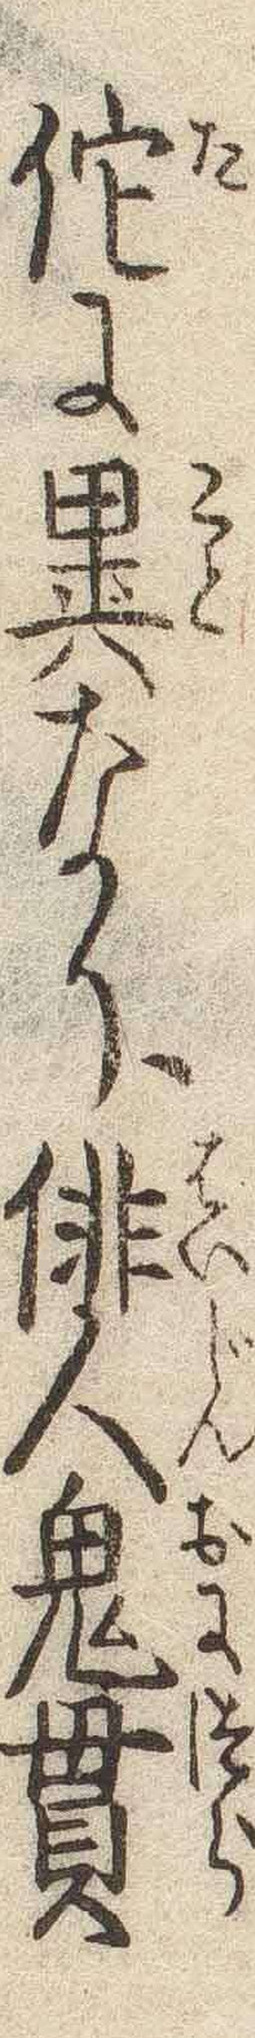佗に異なり。俳人鬼貫
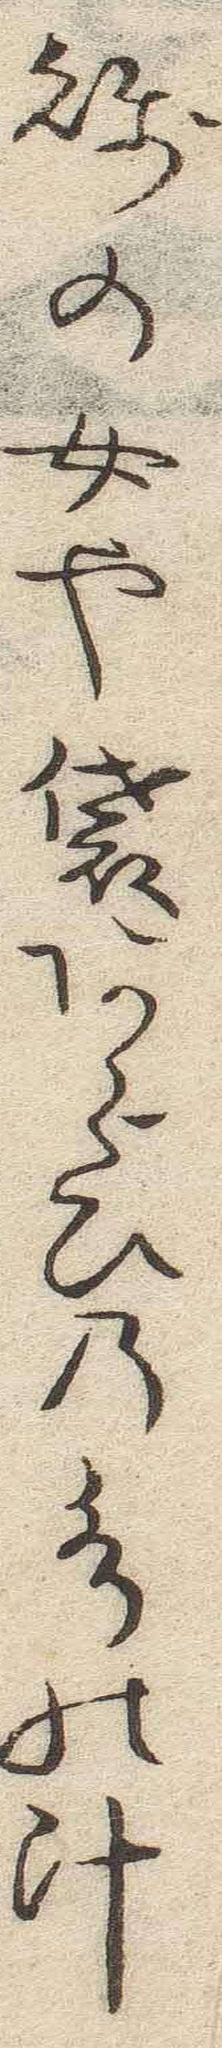賎の女や袋あらひの水の汁
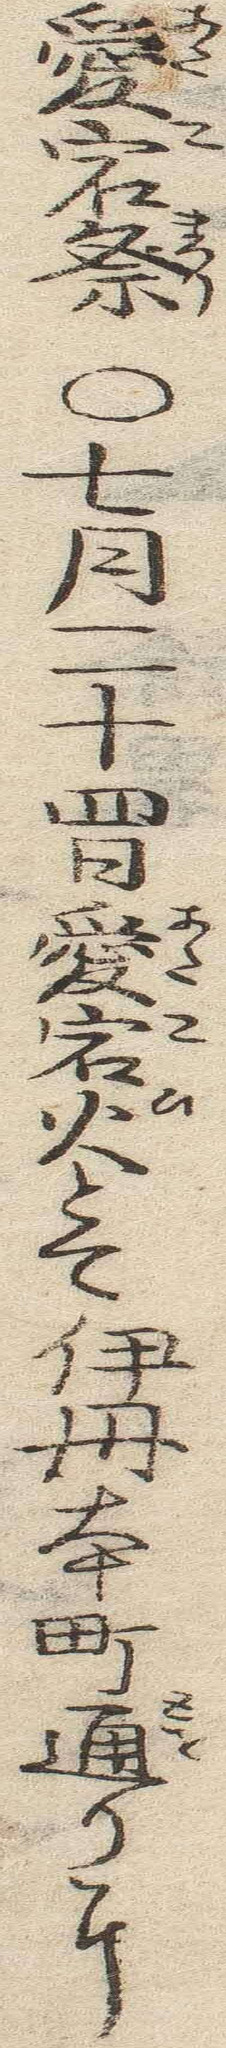愛宕祭○七月二十四日愛宕火とて伊丹本町通りに
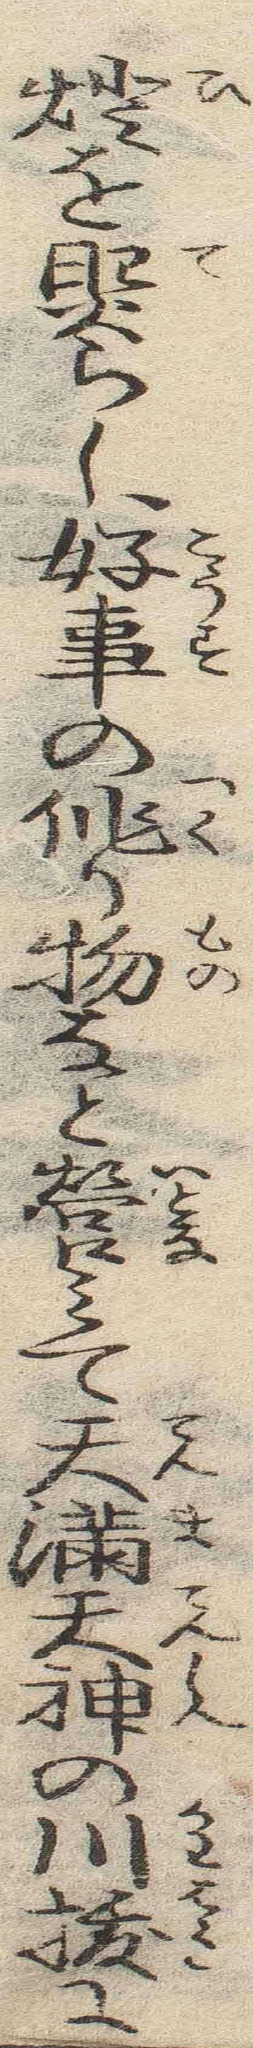燈を照らし。好事の作り物なと営みて天満天神の川㧞に
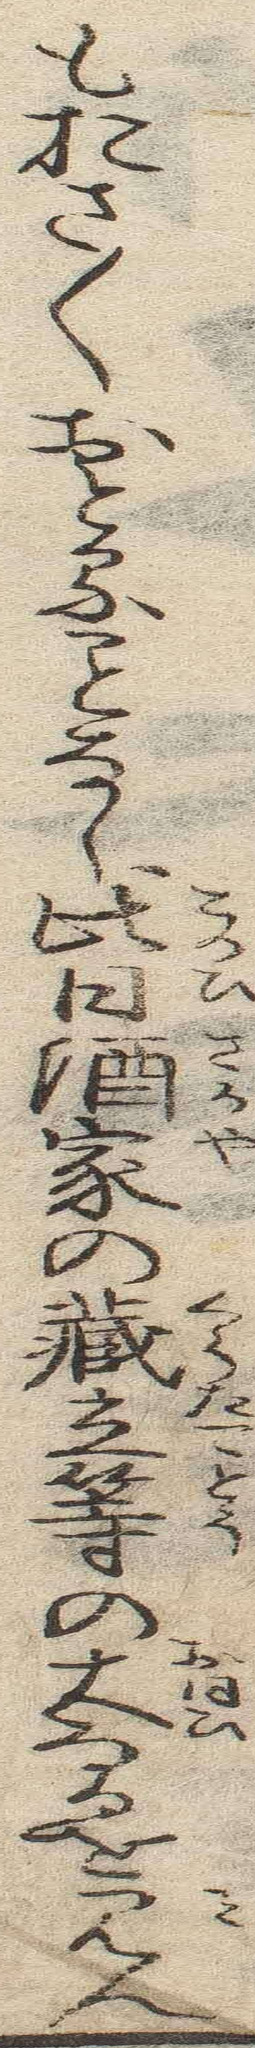もおさ〳〵おとることなし。此日酒家の蔵立等の大なるを見ん
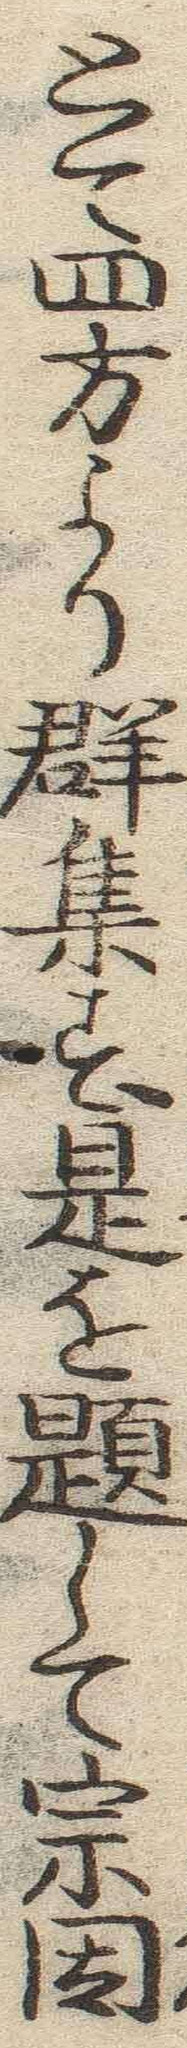とて四方より群集す。是を題して宗因
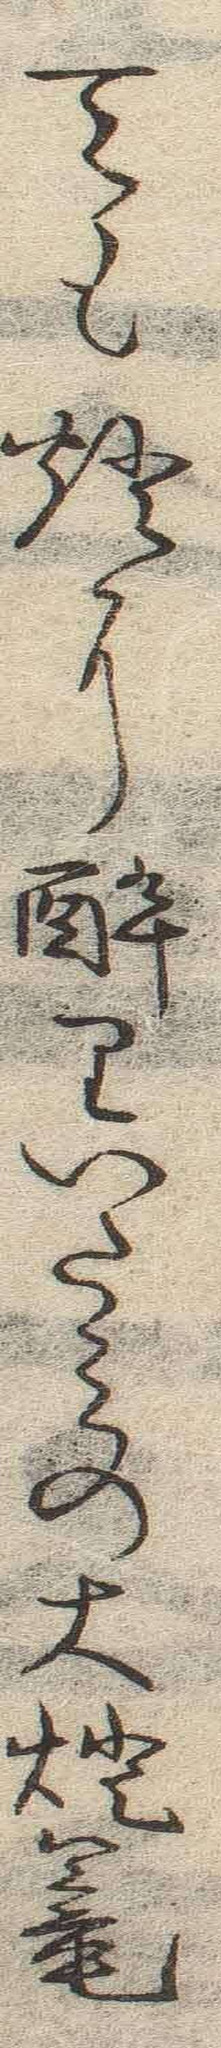ても燈に酔りいたみの大燈篭
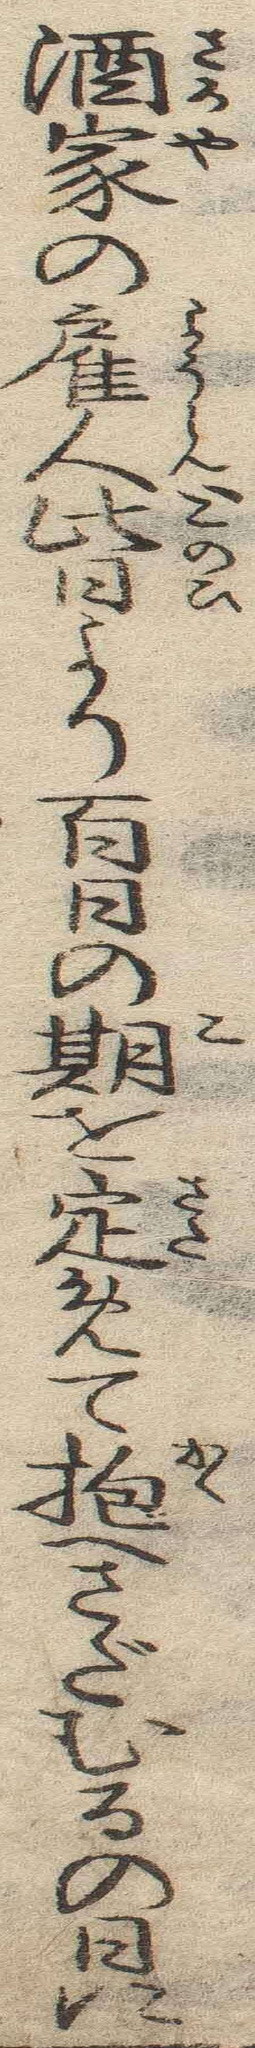酒屋の雇人。此日より百日の期を定めて抱へさだむるの日に
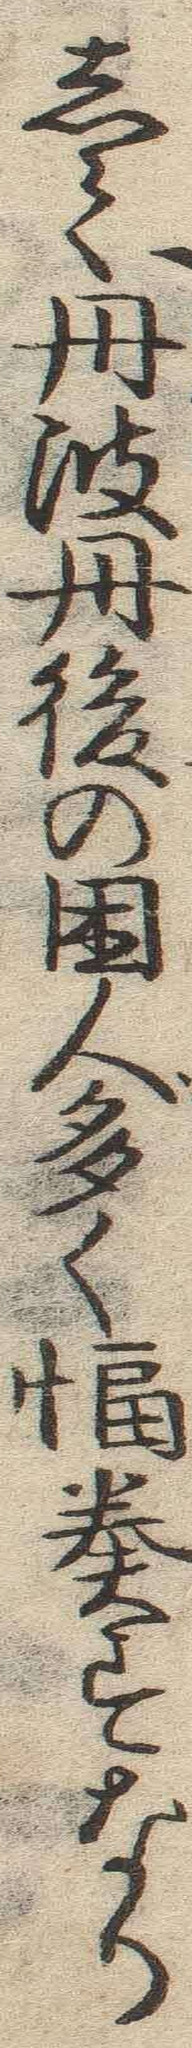して。丹波。丹後。困人多く幅奏すなり

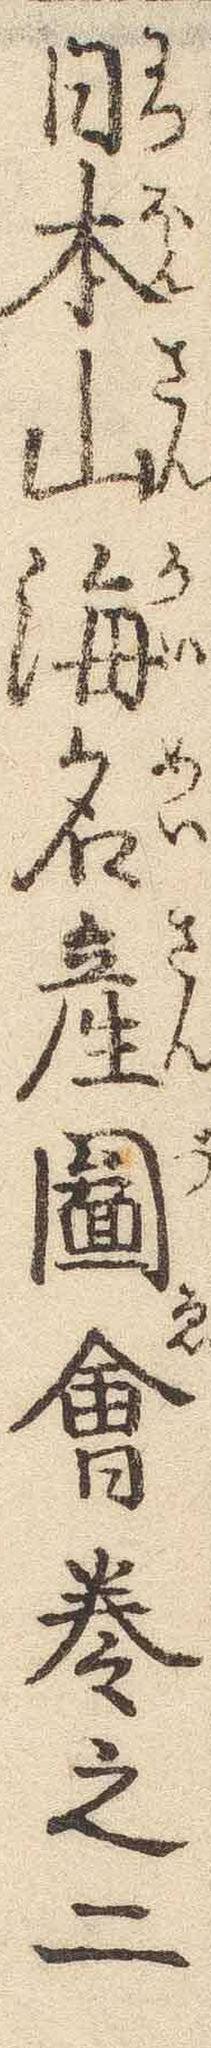日本山海名産図会巻之二
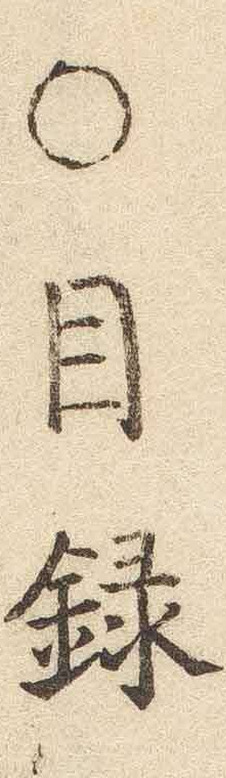○目録
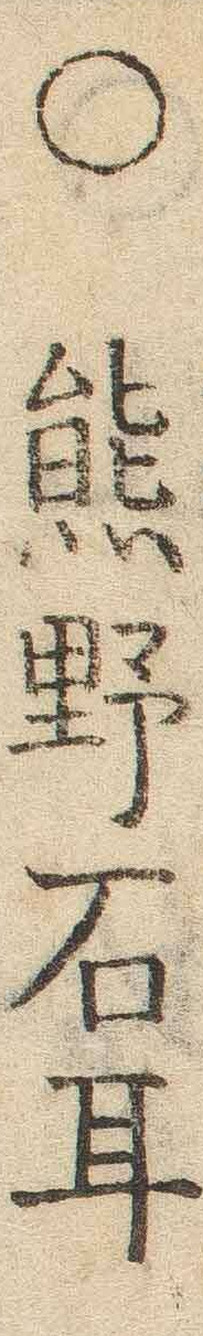○熊野石耳

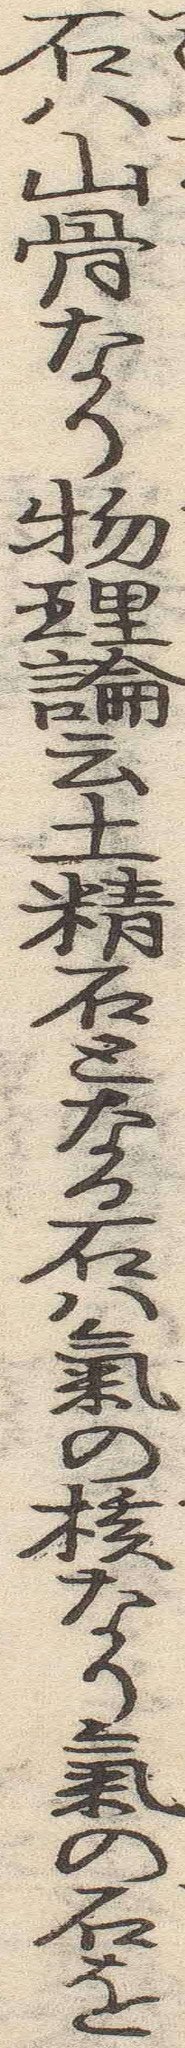石は山骨なり物理論云土精石となる石は気の核なり気の石を
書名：日本山海名産図会
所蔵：東京学芸大学附属図書館 国文学研究資料館
